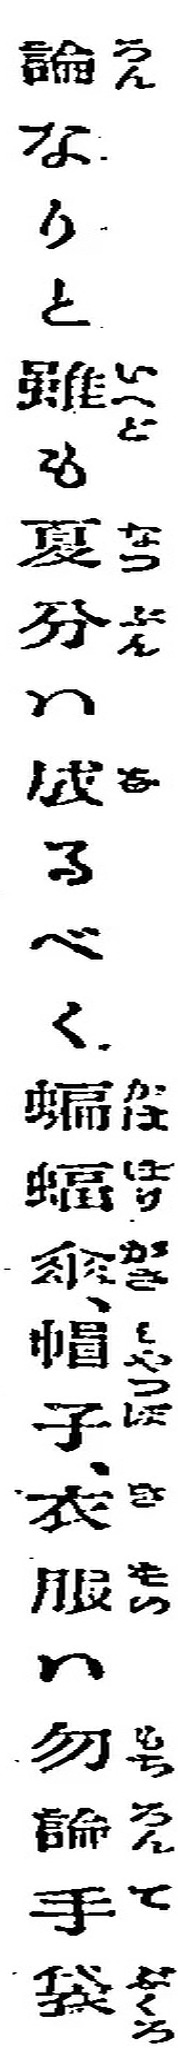論なりと雖も夏分は成るべく蝙蝠傘、帽子、衣服は勿論手袋
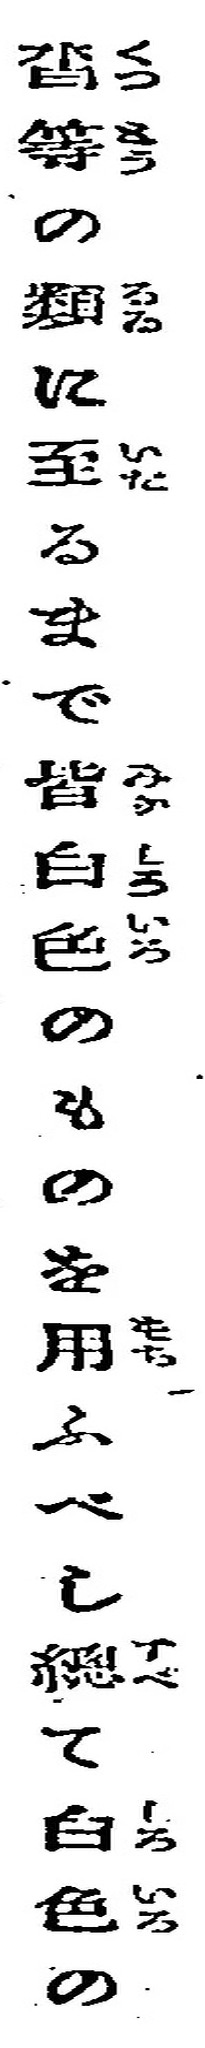沓等の類に至るまで皆白色のものを用ふべし総て白色の
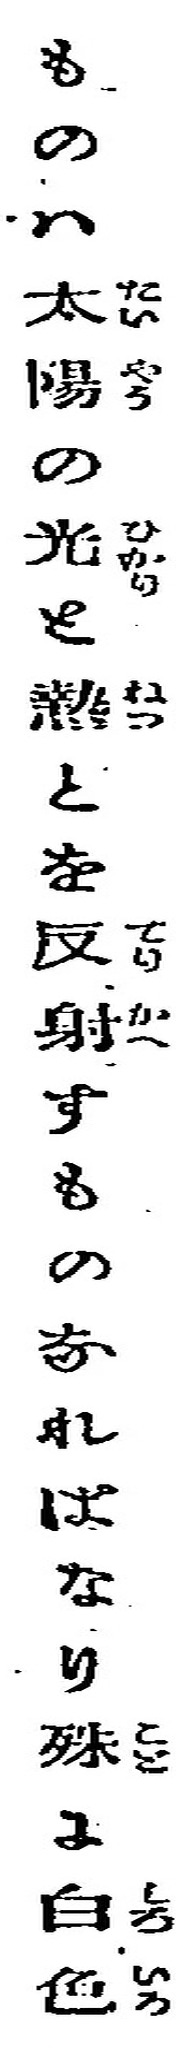ものは太陽の光と熱とを反射すものなればなり殊に白色
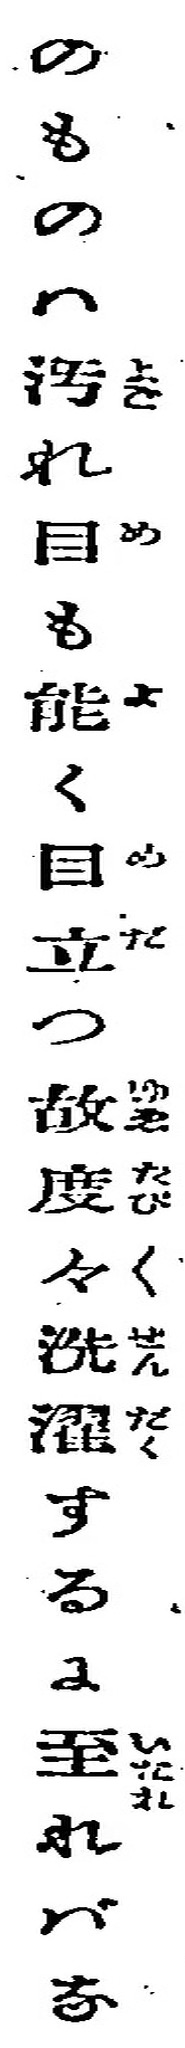のものは汚れ目も能く目立つ故度々洗濯するに至ればな
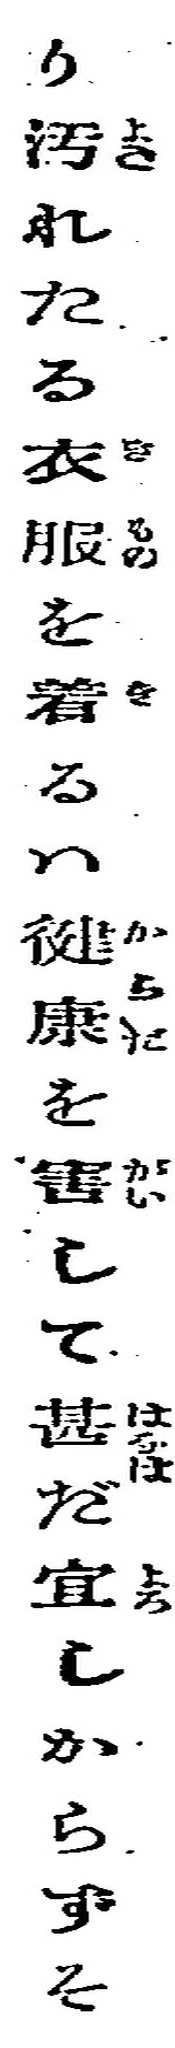り汚れたる衣服を着るは徤康を害して甚だ宜しからずそ
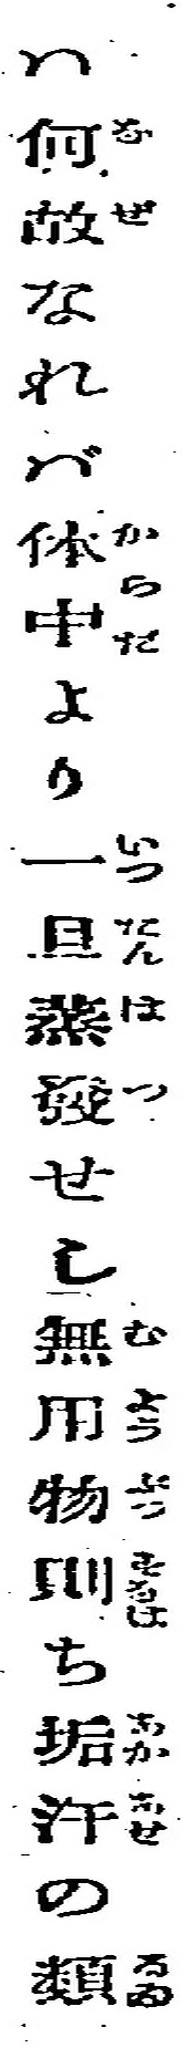は何故なれば体中より一旦蒸発せし無用物則ち垢汗の類
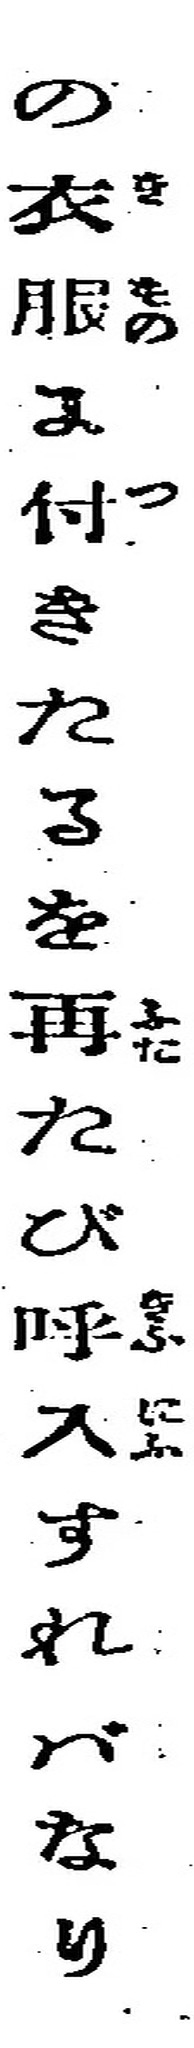の衣服に付きたるを再たび呼入すればなり
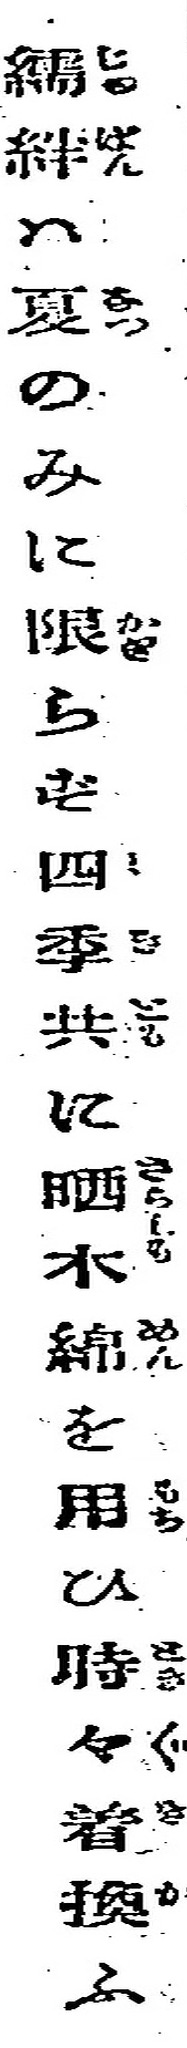襦袢は夏のみに限らず四季共に晒木綿を用ひ時々着換ふ
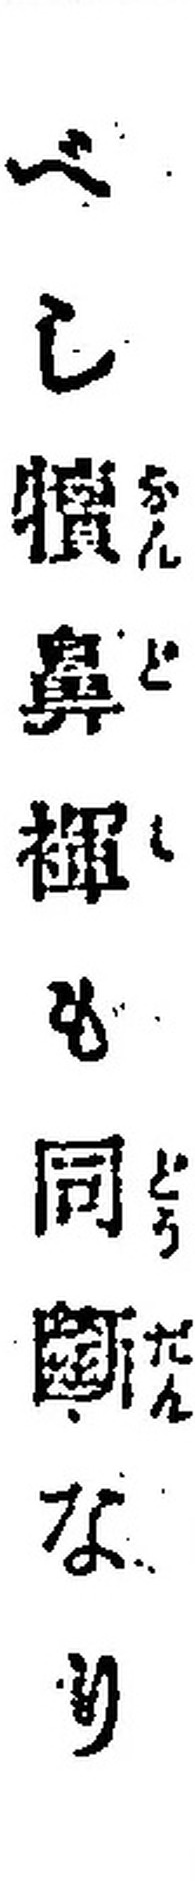べし犢鼻褌も同断なり
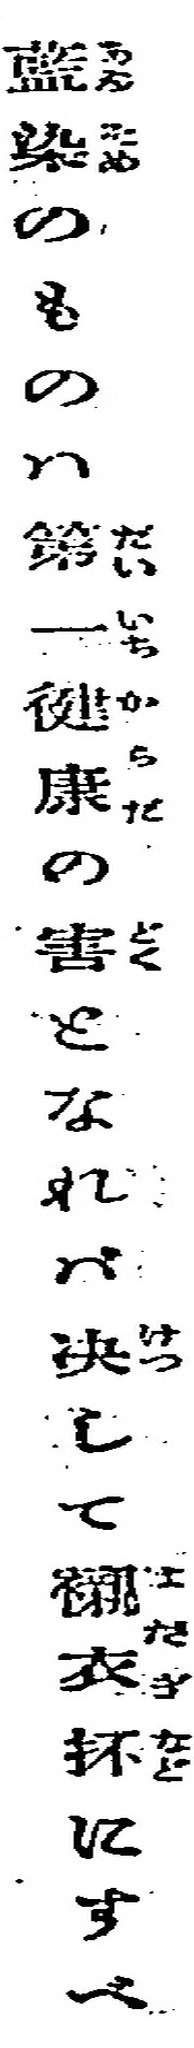藍染のものは第一徤康の毒となれば決して襯衣抔にすべ
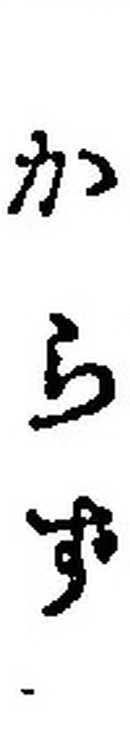からず
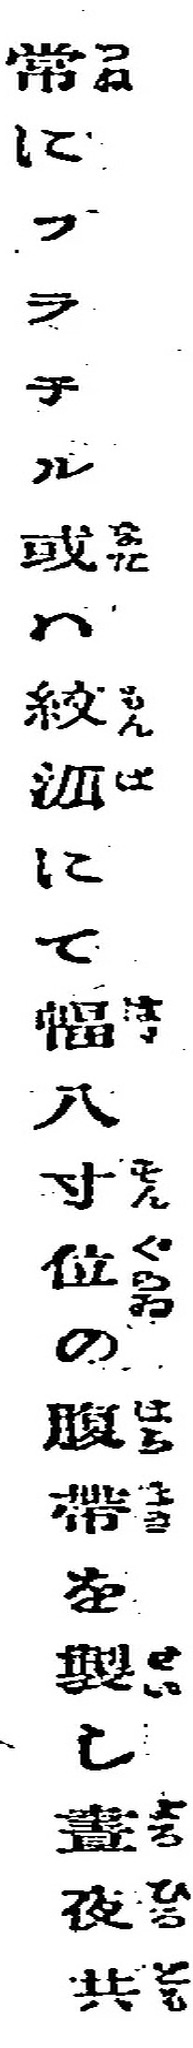常にフランネル或は紋派にて幅八寸位の腹帯を製し晝夜共
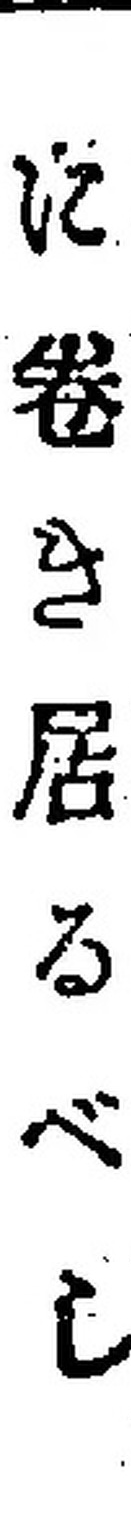に巻き居るべし
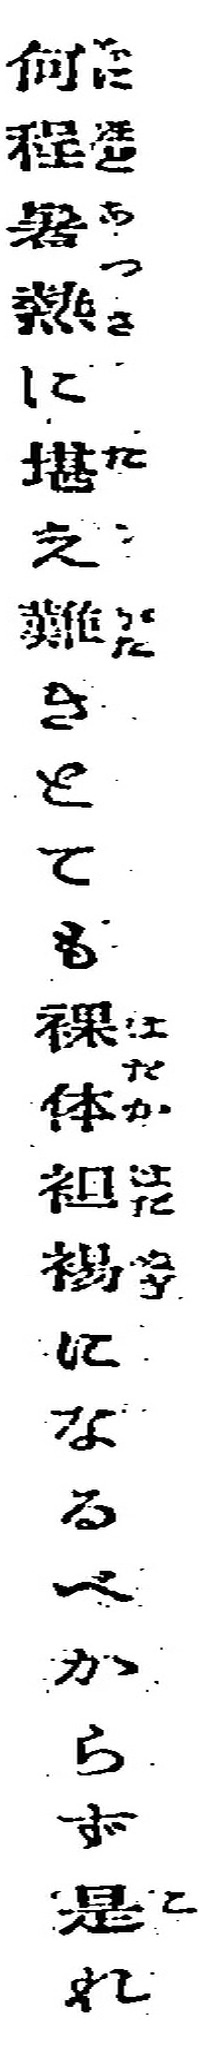何程暑熱に堪え難きとても裸体袒裼になるべからず是れ
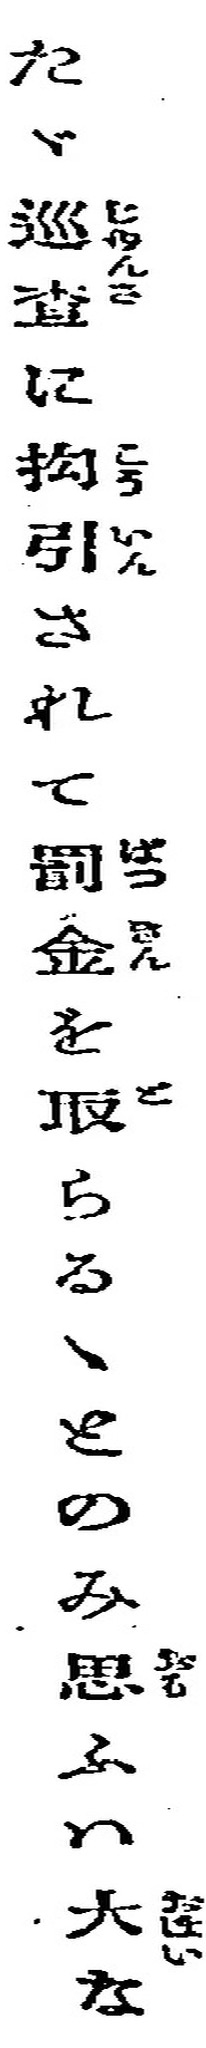たゞ巡査に拘引されて罰金を取らるゝとのみ思ふは大な
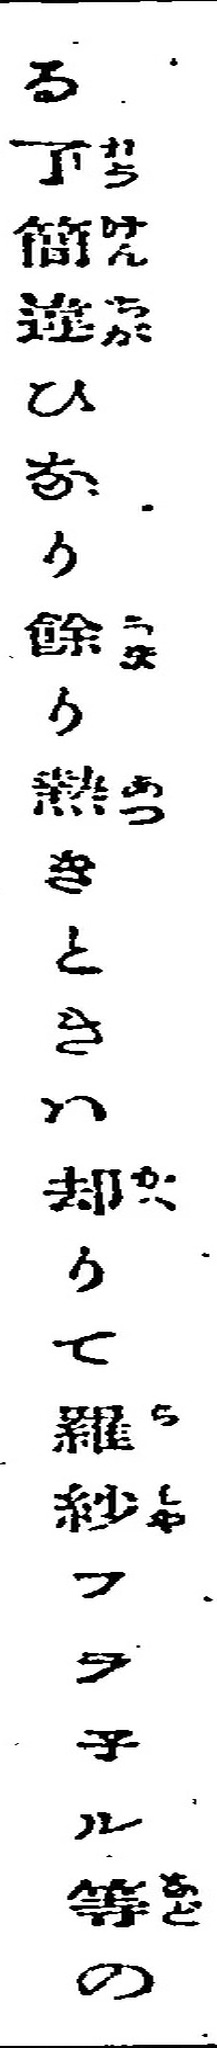る了簡違ひなり餘り熱きときは却りて羅紗フランネル等の
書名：新撰暑中養生法 : 附・コレラ予防歌
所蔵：国立国会図書館 National Diet Library, JAPAN
